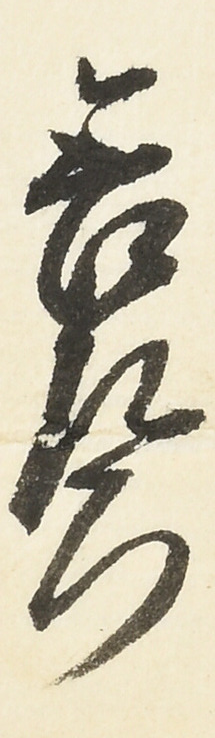藤左衛門
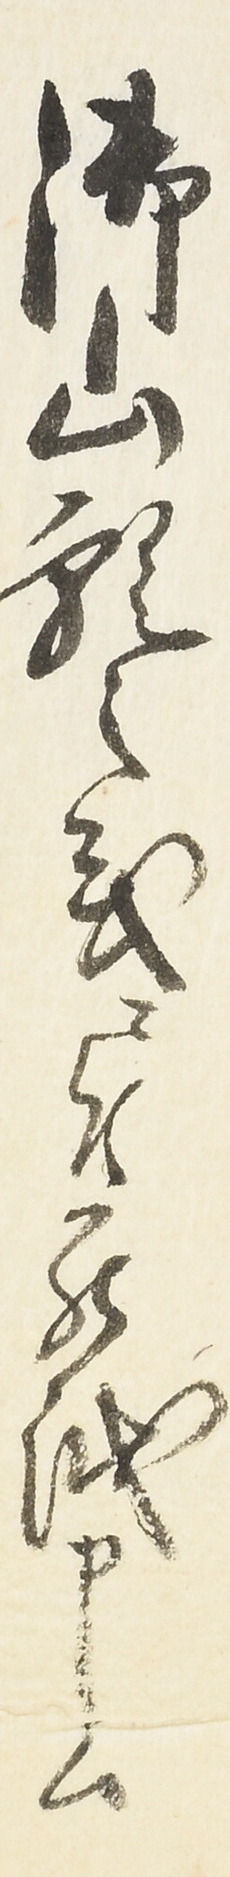御山預之義ニ付罷越申候
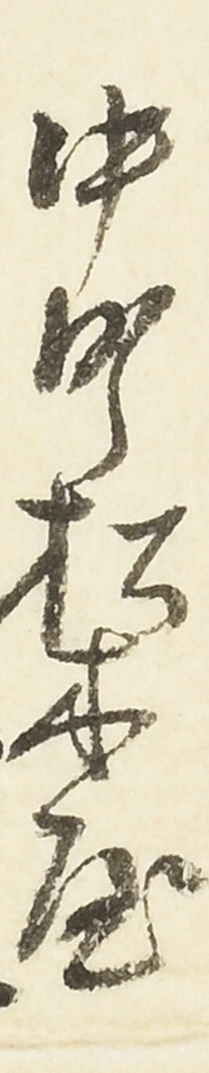中町松木屋
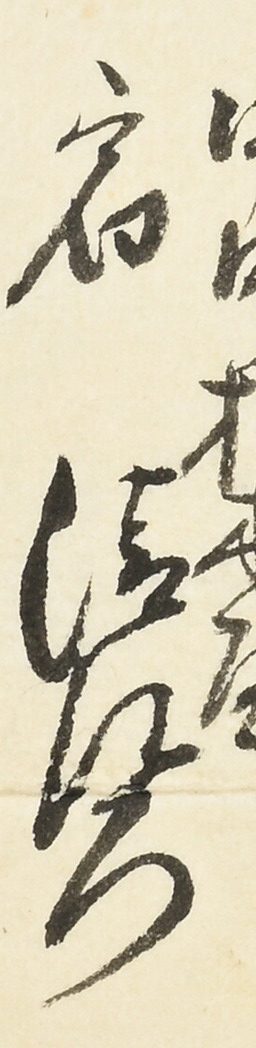宿清左衛門
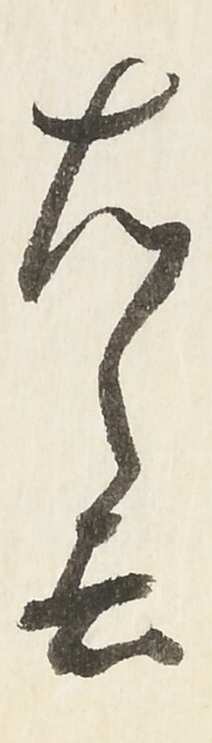右之者

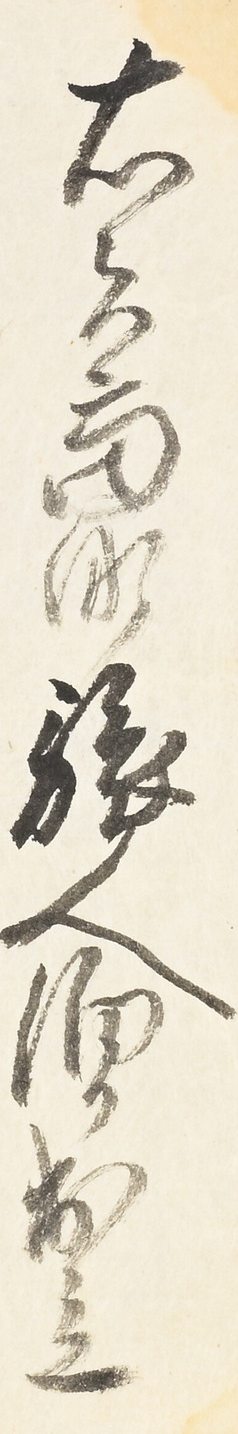右者当町旅人泊リ出立
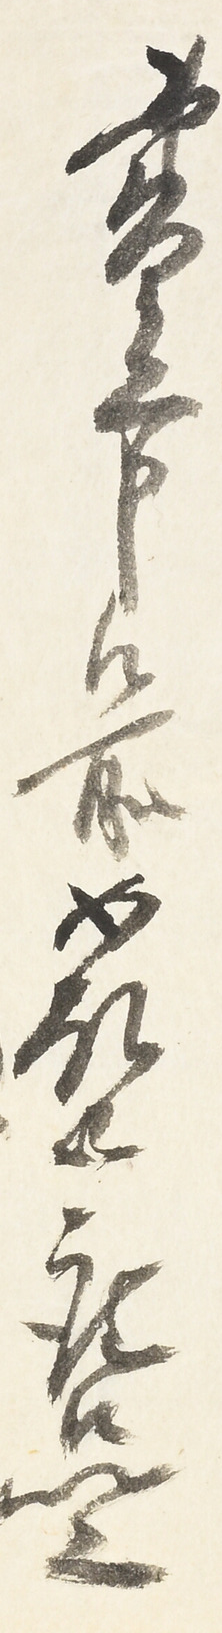書上申候所如斯御座候以上
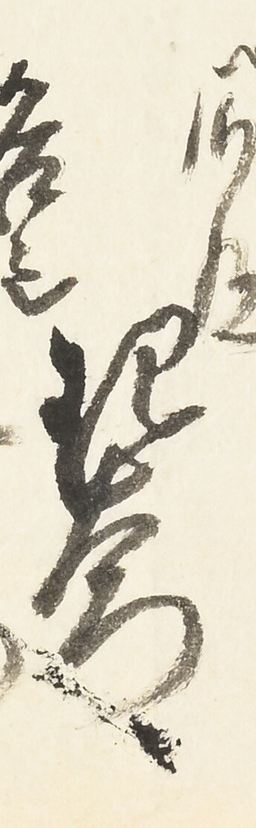戌理右衛門
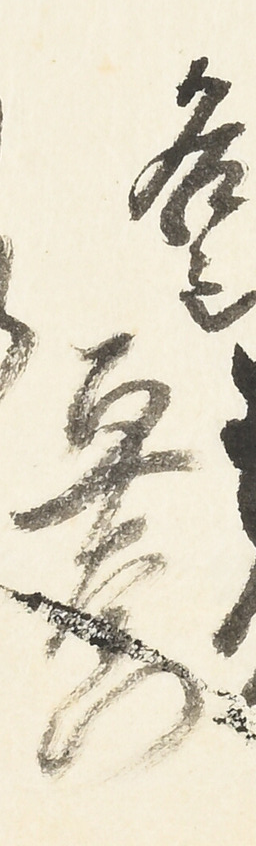平右衛門
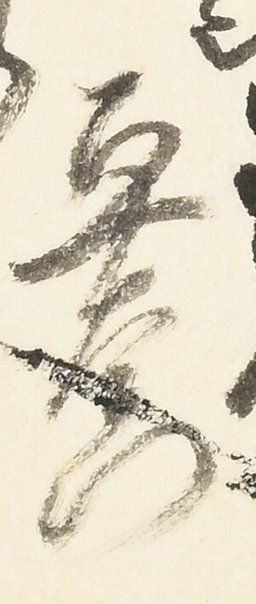戌理右衛門
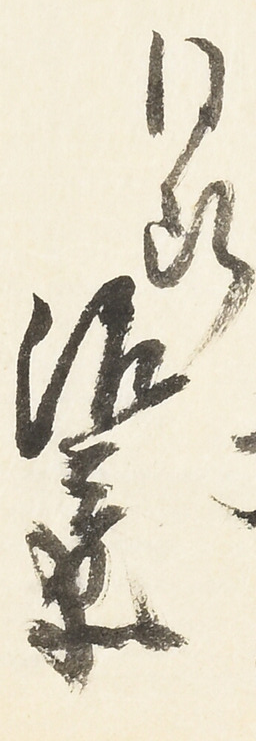治兵衛
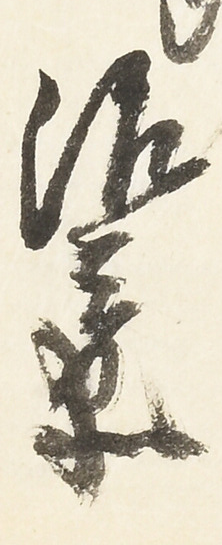治兵衛
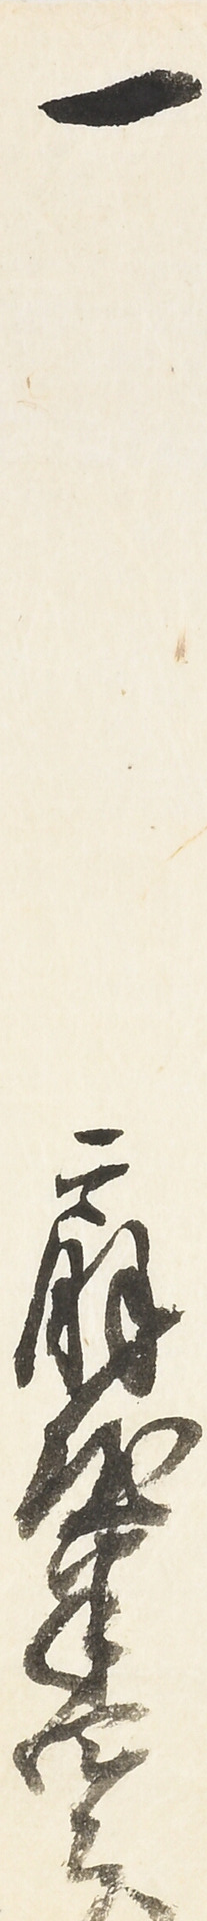一扇屋半四郎
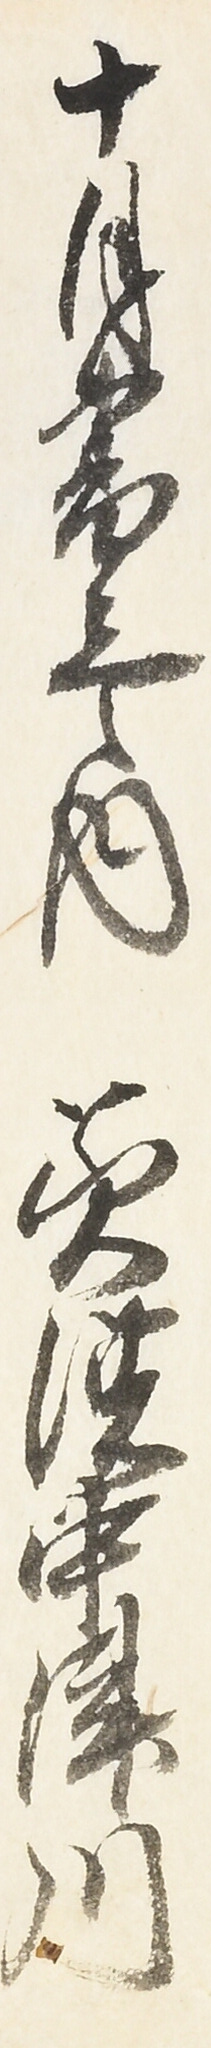十月書上之内美濃中津川
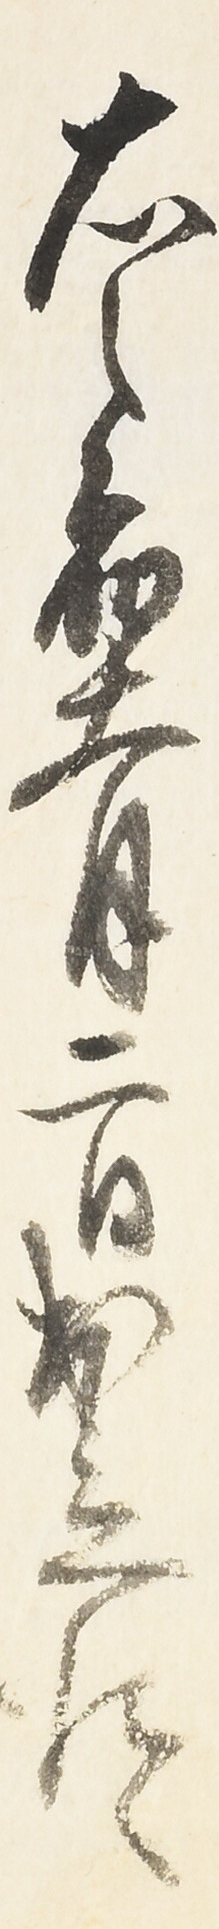右之者十一月二日出立仕候
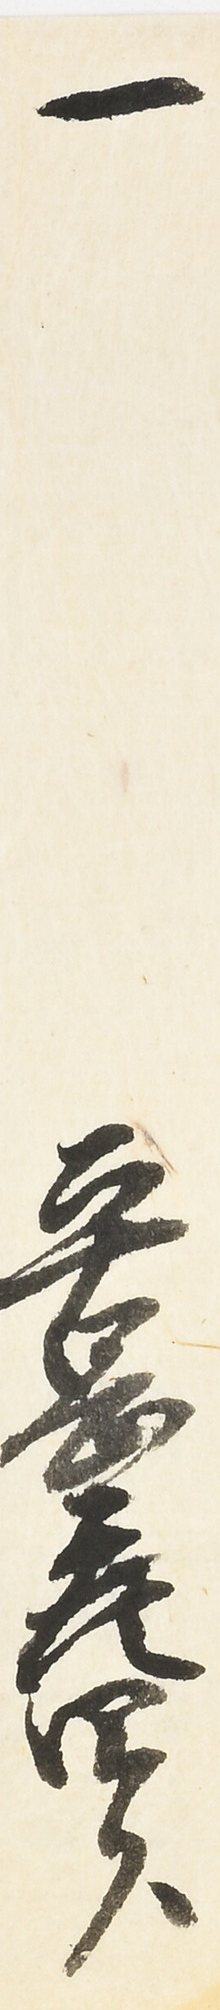一平岡彦四郎
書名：町中旅人泊控帳
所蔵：伊那市立高遠町図書館・合同会社AMANE
